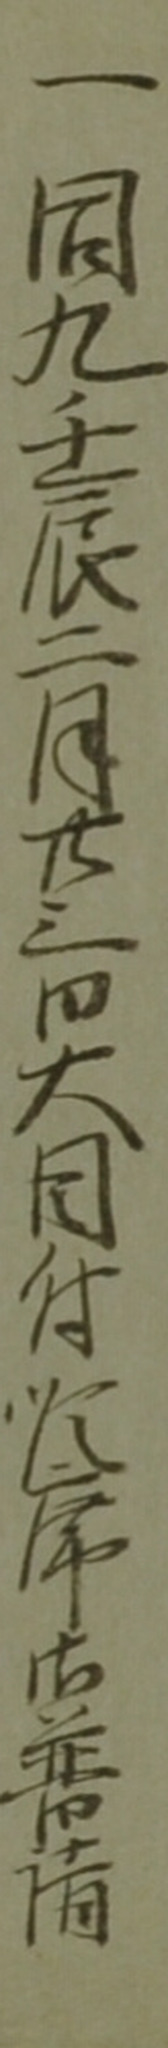一同九壬辰二月廿三日大目付順席御普請
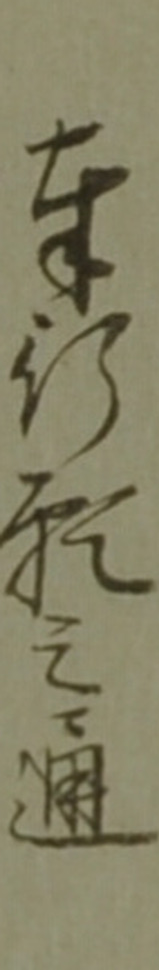奉行願之通
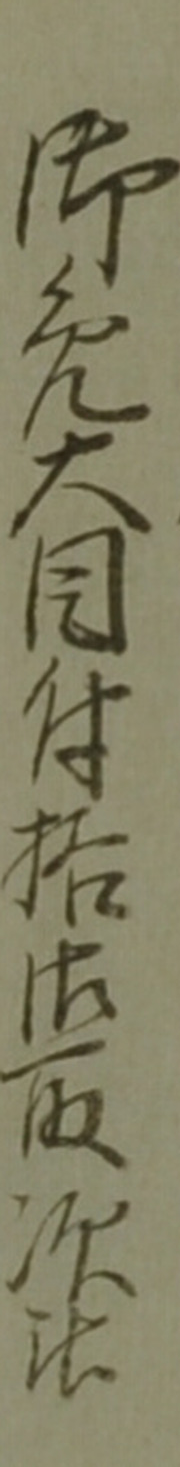御免大目付格御取次被
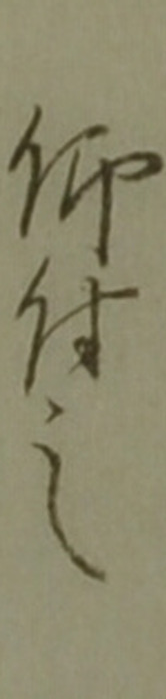仰付之
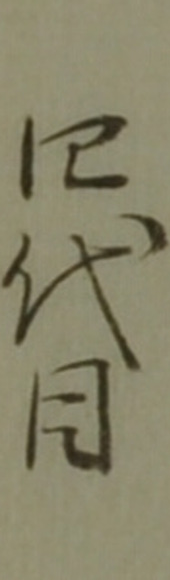四代目
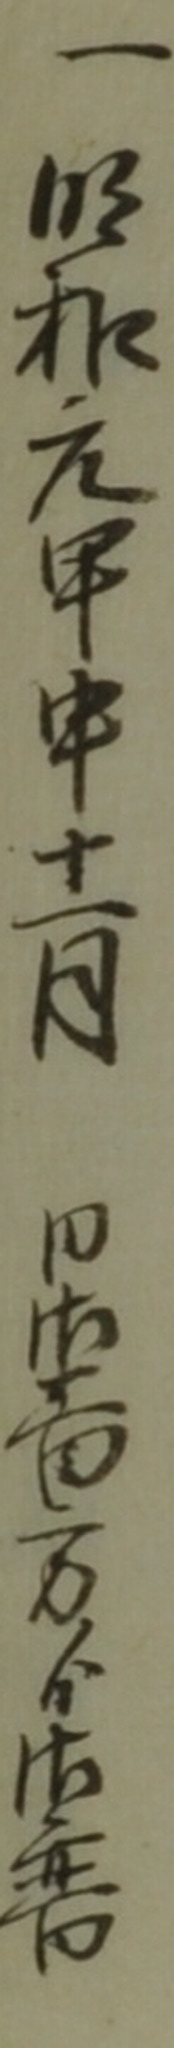一明和元甲申十一月日御番方ゟ御普
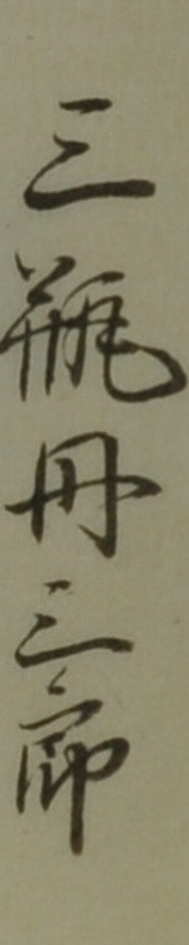三瓶丹三郎
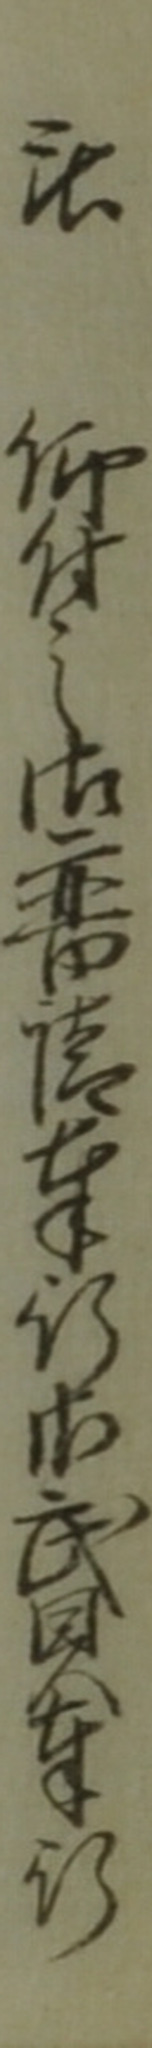被仰付之御普請奉行御武具奉行
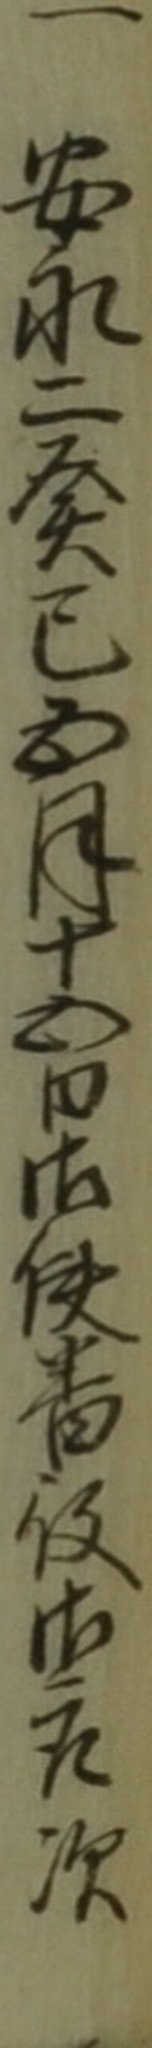一安永二癸巳五月十五日御使番役御取次
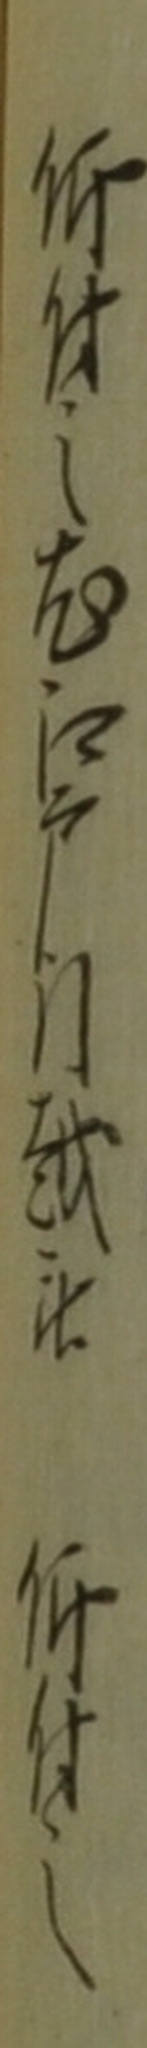仰付之尤江戸引越被仰付之
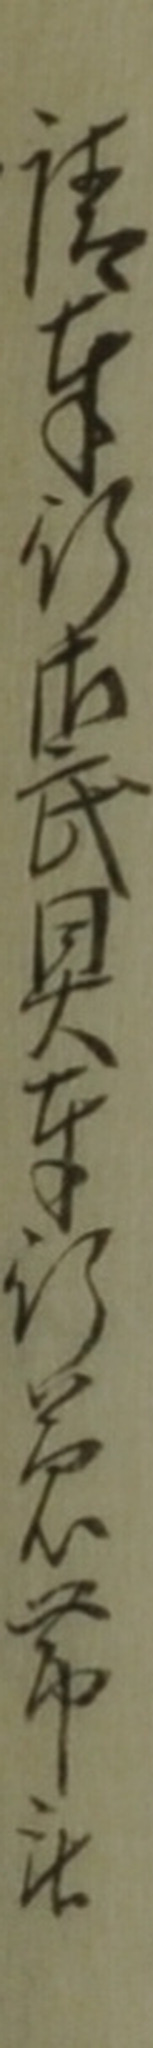請奉行御武具奉行兼帯被
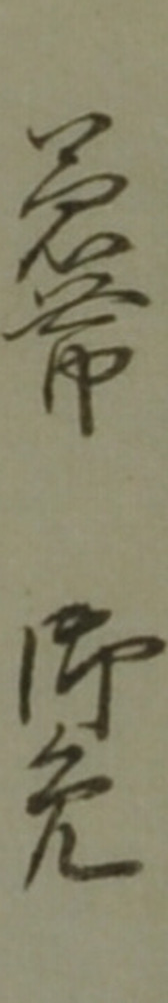兼帯御免
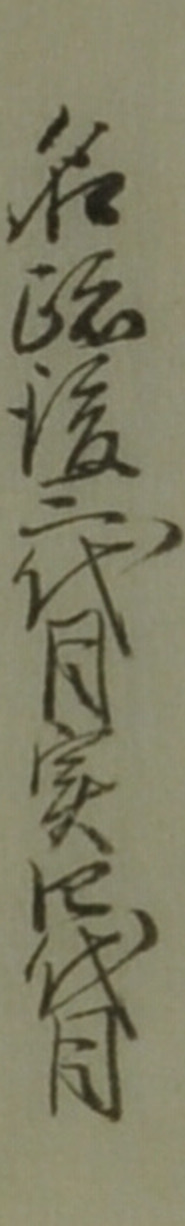名跡後三代目実四代目
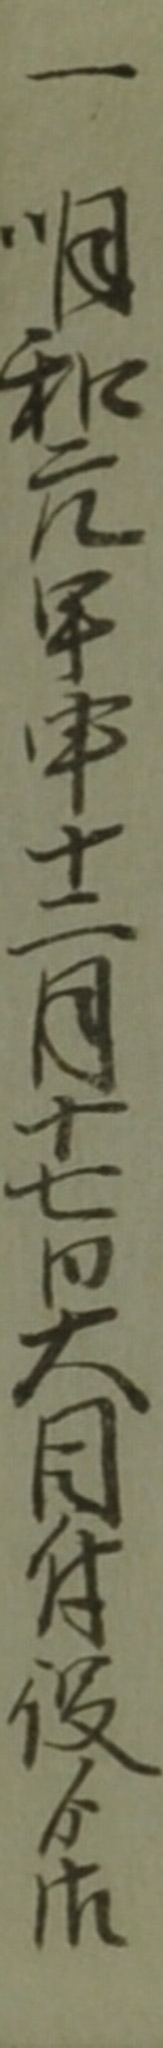一明和元甲申十二月十七日大目付役ゟ御
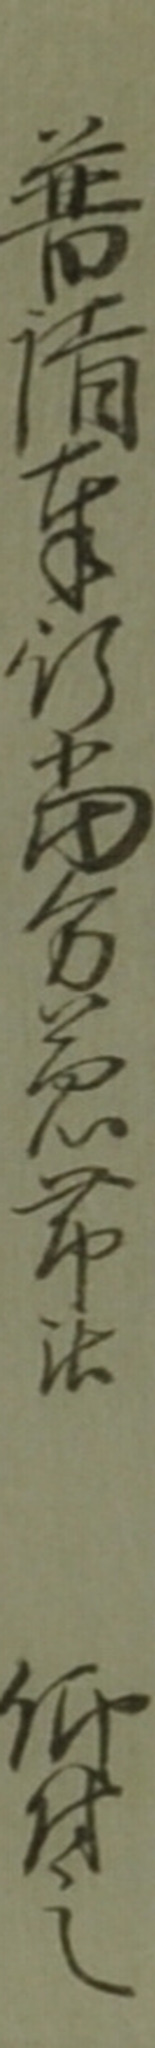普請奉行当分兼帯被仰付之
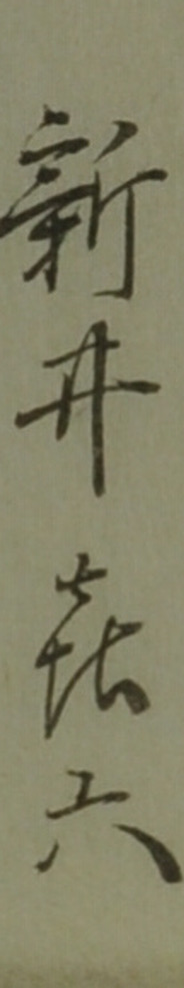新井喜六
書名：諸御役代々録（六）
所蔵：伊那市立高遠町図書館・合同会社AMANE
